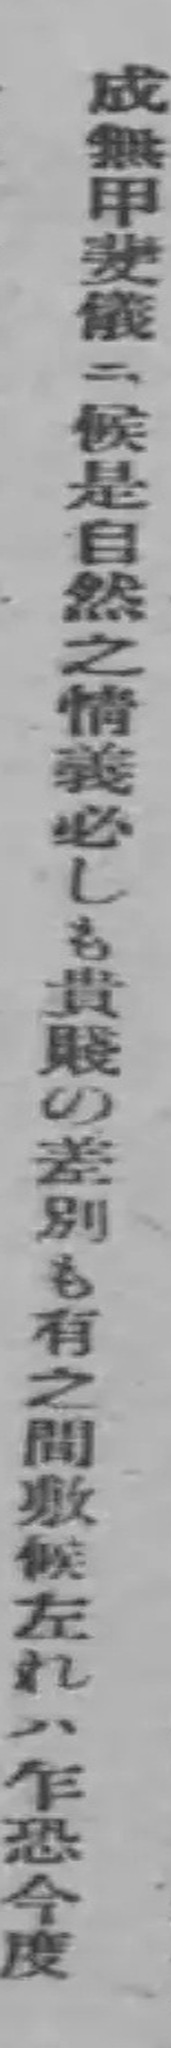成無甲斐儀ニ候是自然之情義必しも貴賤の差別も有之間敷候左れは乍恐今度
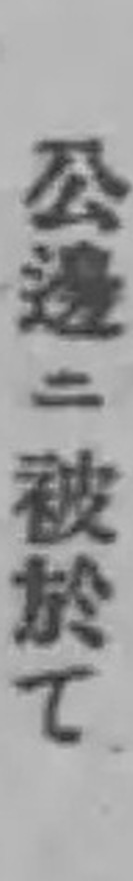公辺ニ被於て
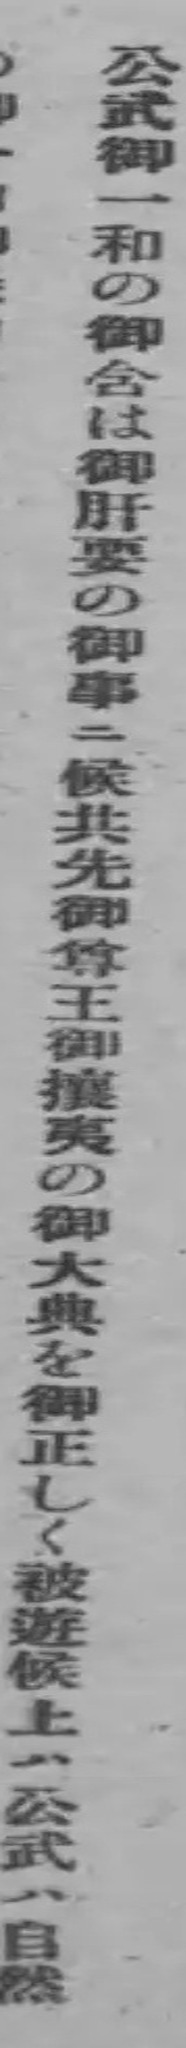公武御一和の御含は御肝要の御事ニ候共先御尊王御攘夷の御大典を御正しく被遊候上は公武は自然
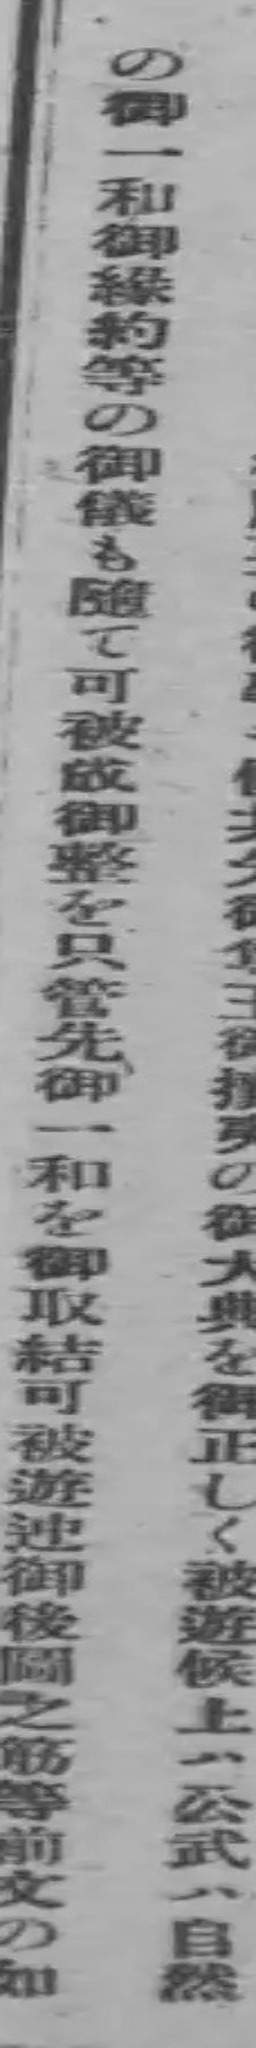の御一和御縁約等の御儀も随て可被成御整を只管先御一和を御取結可被迚御後図之筋等前文の如
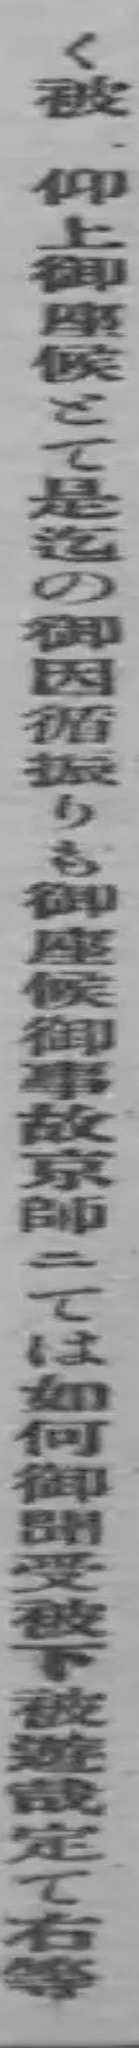く被仰上御座候とて是迄の御因循振りも御座候御事故京師ニては如何御聞受被下被遊哉定て右等
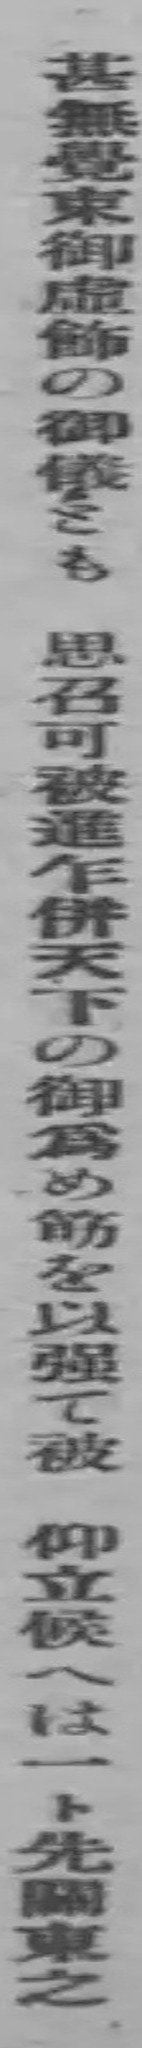甚無覚束御虚飾の御儀とも思召可被進乍併天下の御為め筋を以強て被仰立候へは一ト先関東之
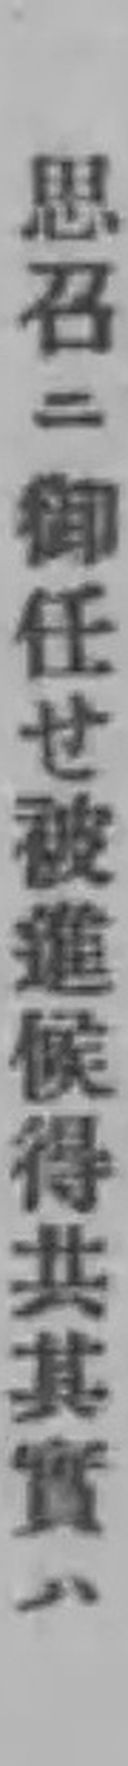思召ニ御任せ被進候得共其実は
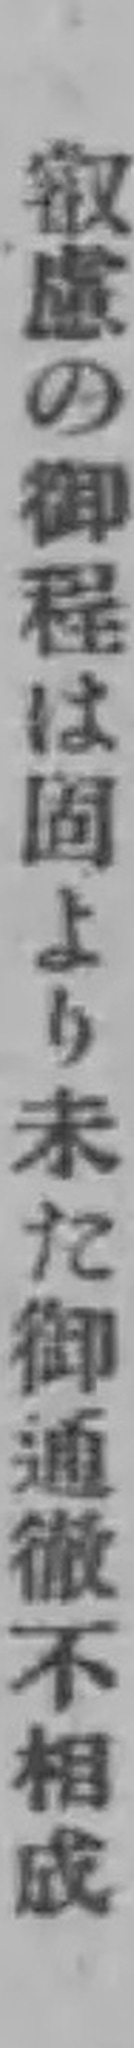叡慮の御程は固より未た御通徹不相成
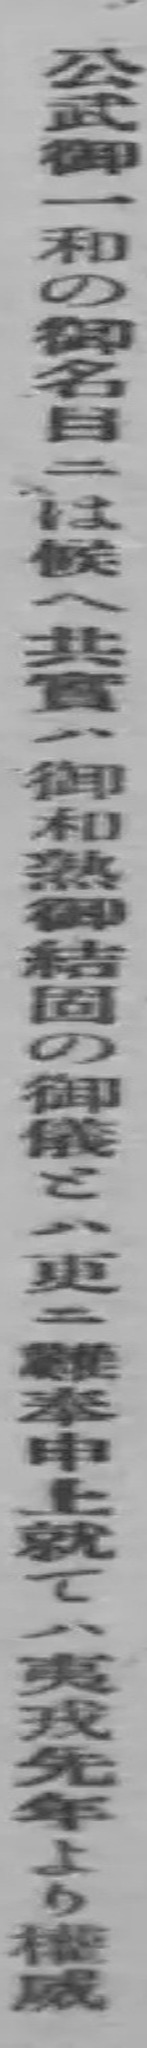公武御一和の御名目ニは候へ共実は御和熟御結固の御儀とは更ニ難奉申上就ては夷戎先年より権威
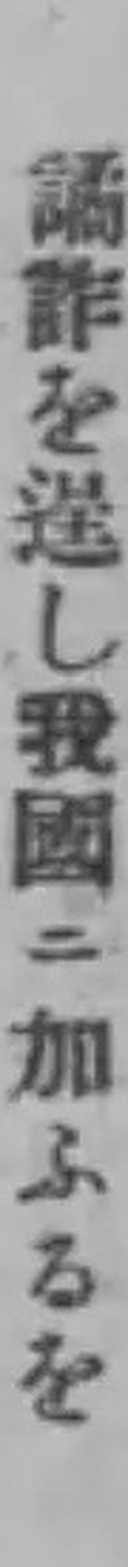譎詐を逞し我国ニ加ふるを
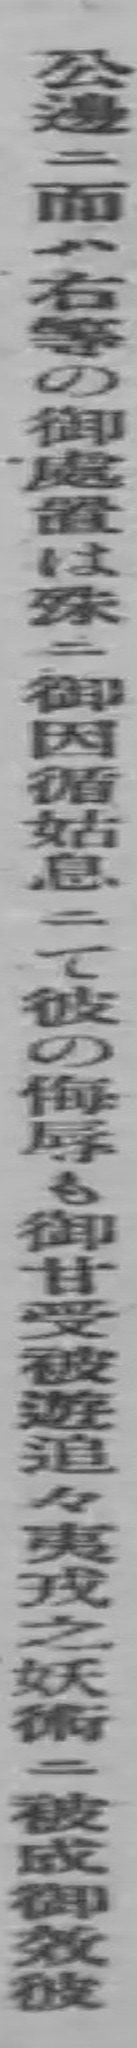公辺ニ而は右等の御処置は殊ニ御因循姑息ニて彼の侮辱も御甘受被遊追々夷戎之妖術ニ被成御效彼
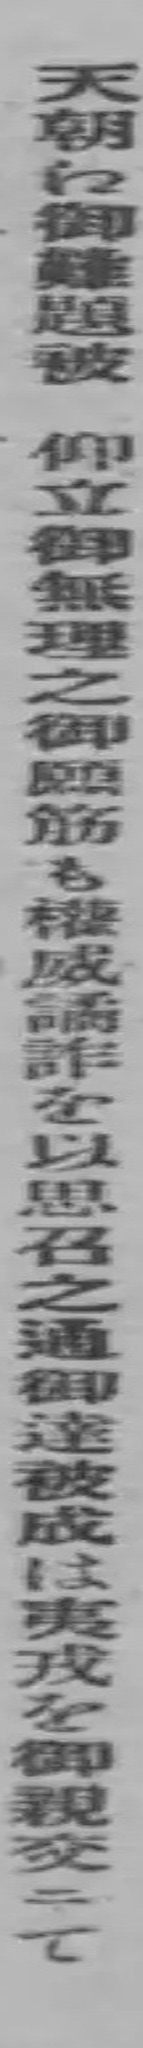天朝え御難題被仰立御無理之御願筋も権威譎詐を以思召之通御達被成は夷戎を御親交ニて
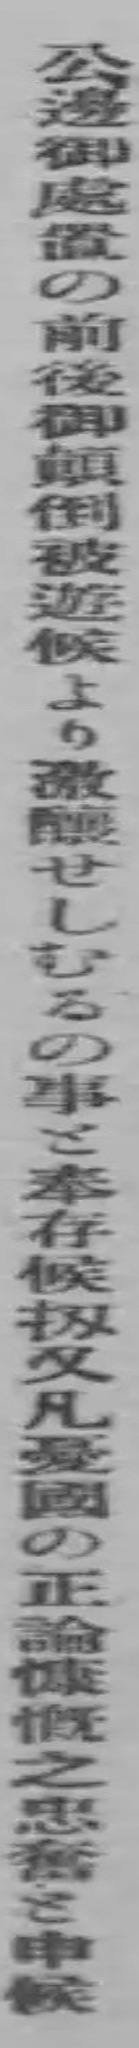公辺御処置の前後御顚倒被遊候より激醸せしむるの事と奉存候扨又凡憂国の正論慷慨之忠奮と申候
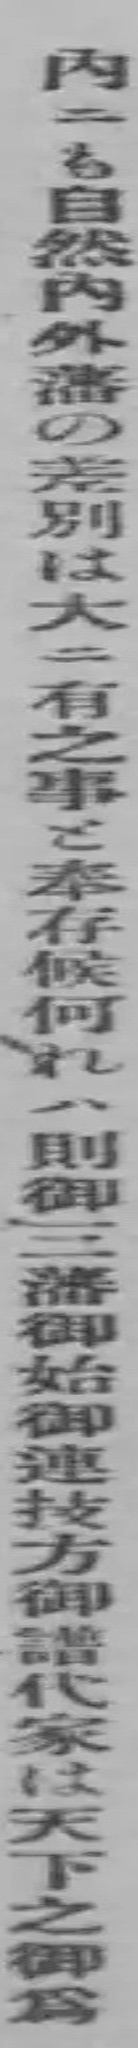内ニも自然内外藩の差別は大ニ有之事と奉存候何れは則御三藩御始御連枝方御譜代家は天下之御為
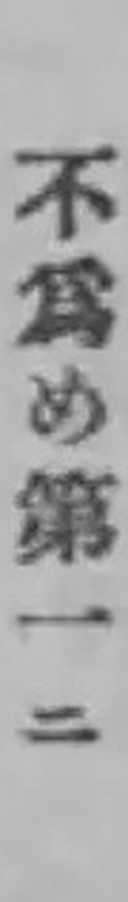不為め第一ニ
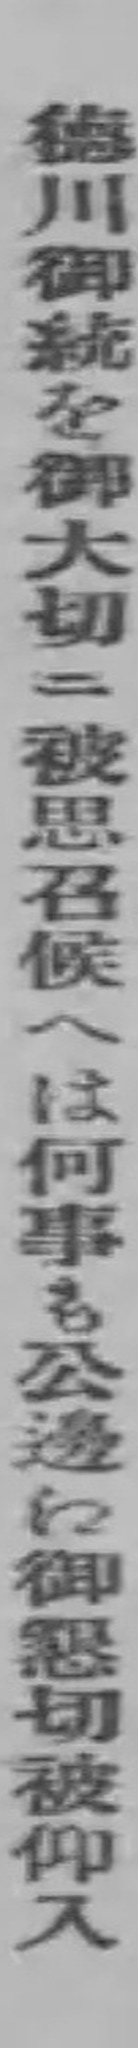徳川御統を御大切ニ被思召候へは何事も公辺え御懇切被仰入
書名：豊橋市史談
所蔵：国立国会図書館 National Diet Library, JAPAN
